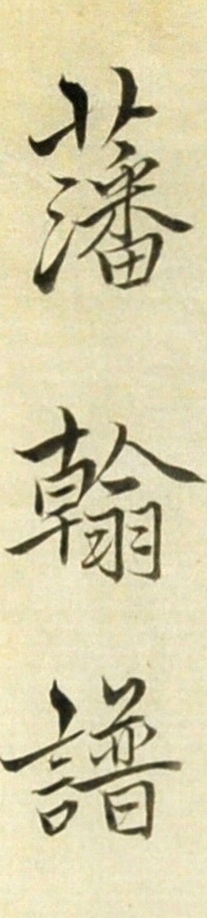藩翰譜

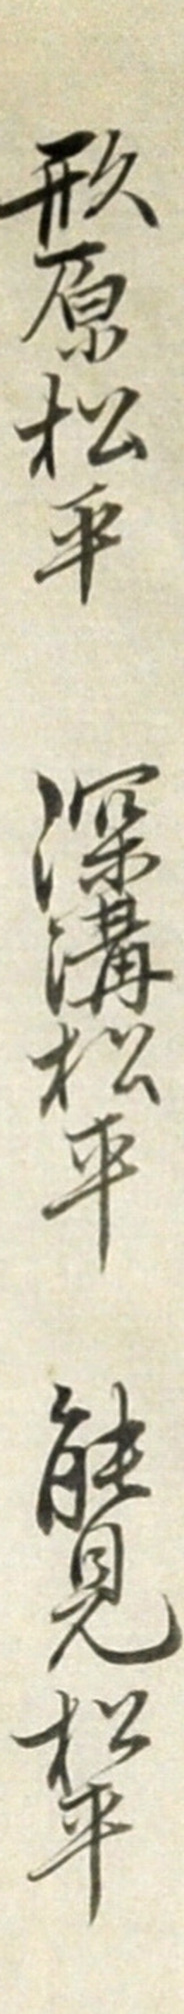形原松平深溝松平能見松平
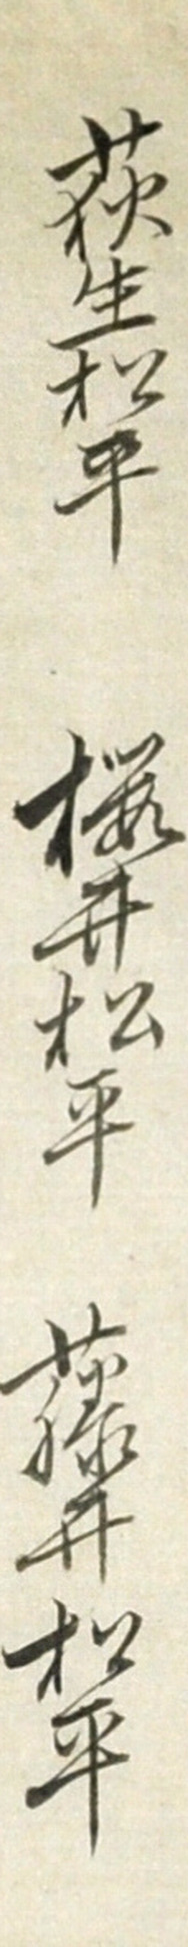荻生松平桜井松平藤井松平
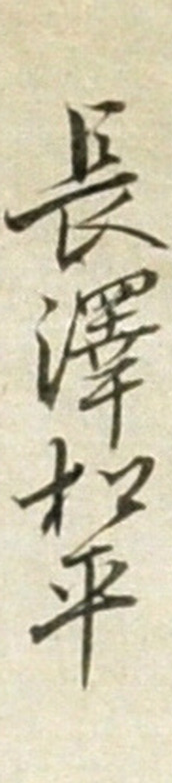長澤松平
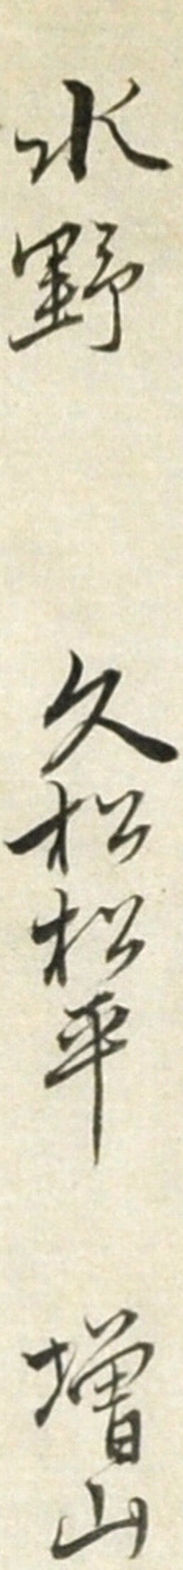水野久松松平増山
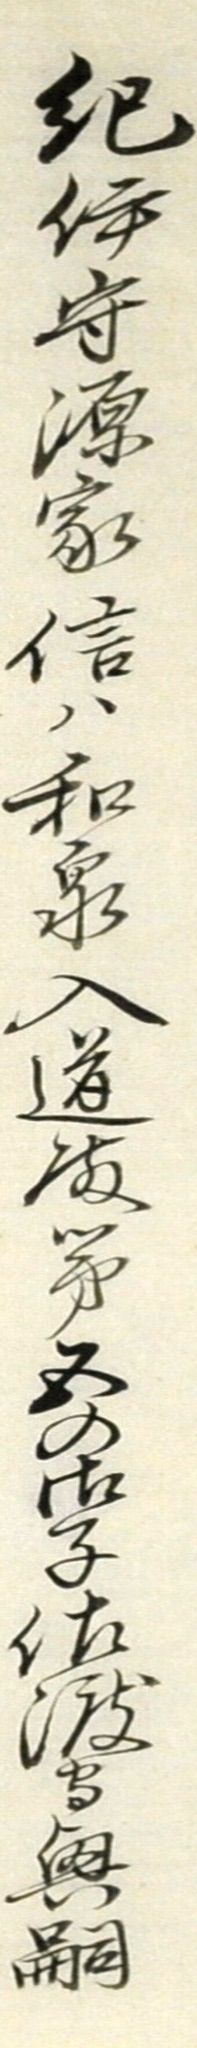紀伊守源家信は和泉入道殿第五の御子佐渡守奥嗣
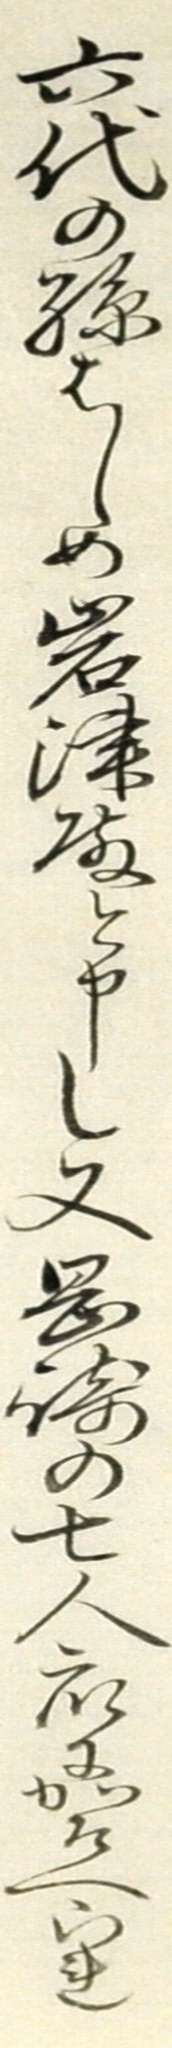六代の孫はしめ岩津殿と申し又岡崎の七人衆にかそへられ
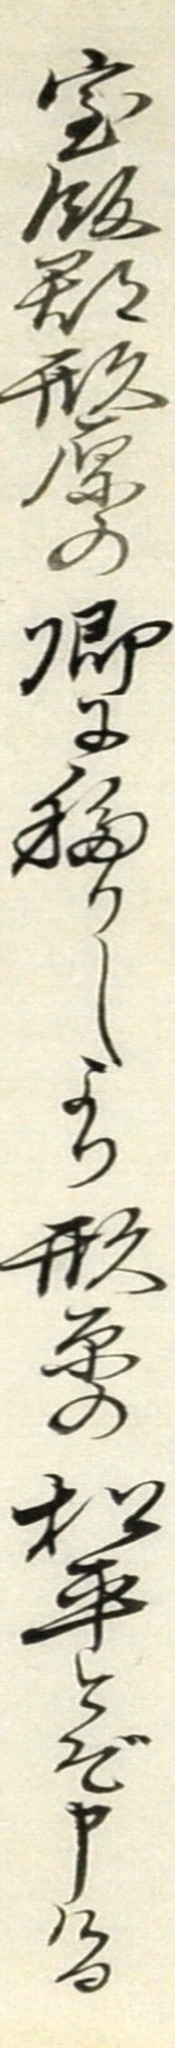宝飯郡形原の郷に移りしより形原の松平とぞ申ける
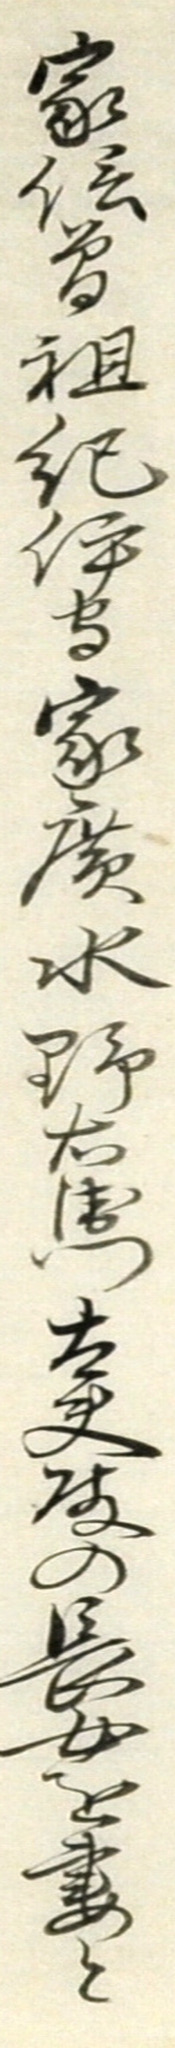家信曾祖紀伊守家廣水野右衛門太夫殿の長女を妻と
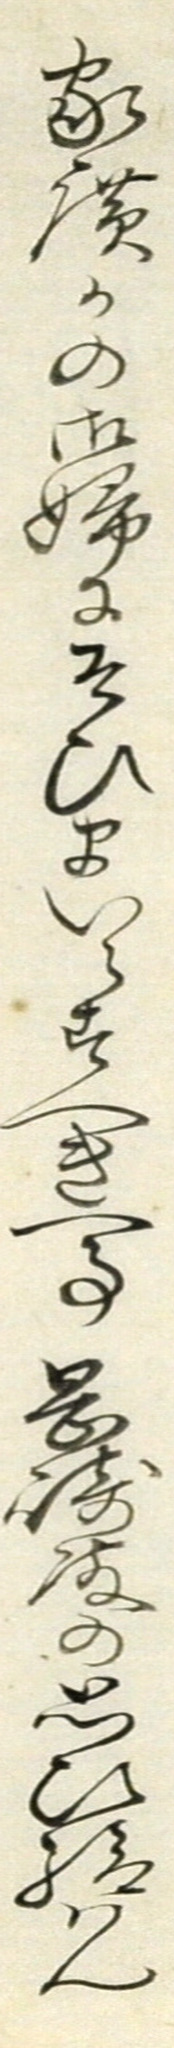家廣かの御婦にそひまいらすへき一事岡崎殿の思ひ給はん
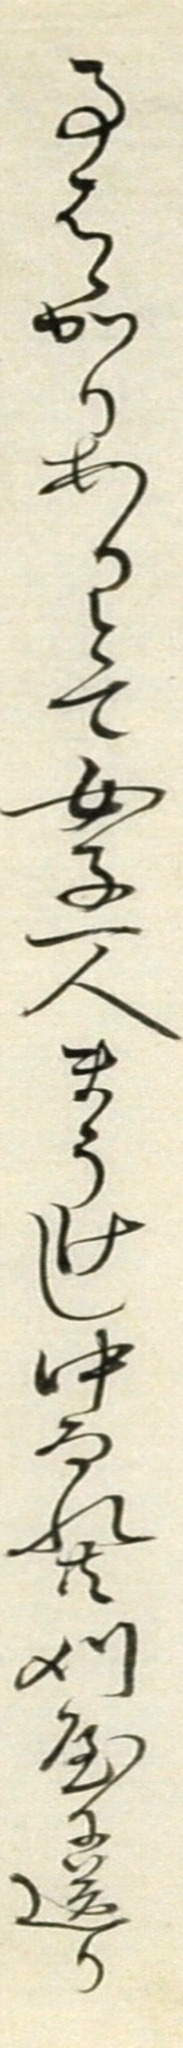事はゝかりありとて女子一人まうけし中なれ共刈屋に送り
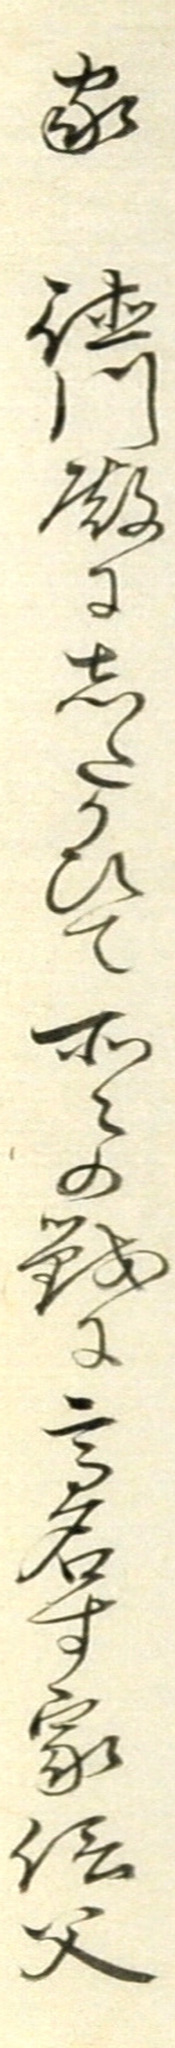家徳川殿にしたかひて所々の戦に高名す家信父

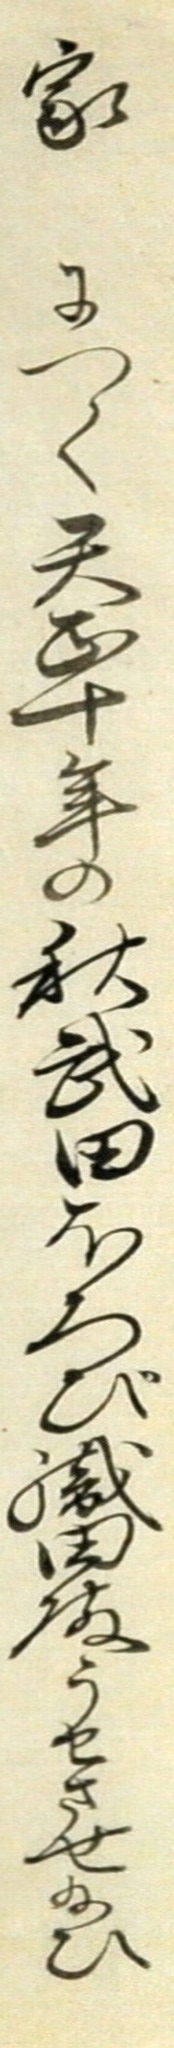家につく天正十年の秋武田ほろび織田殿うせさせ給ひ
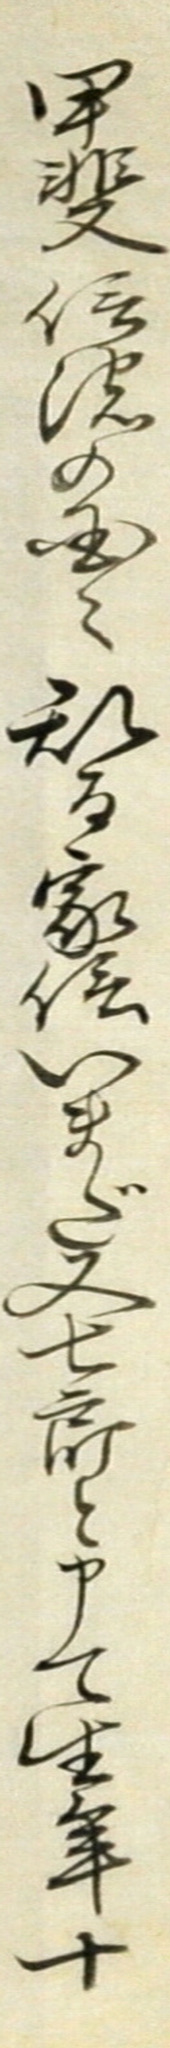甲斐信濃の国々乱る家信いまだ又七郎と申て生年十
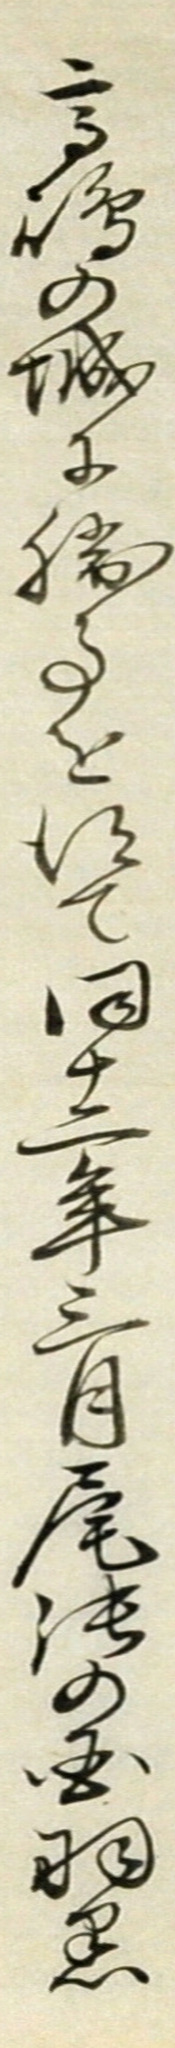高島の城に勝事を得て同十二年三月尾張の国羽黒
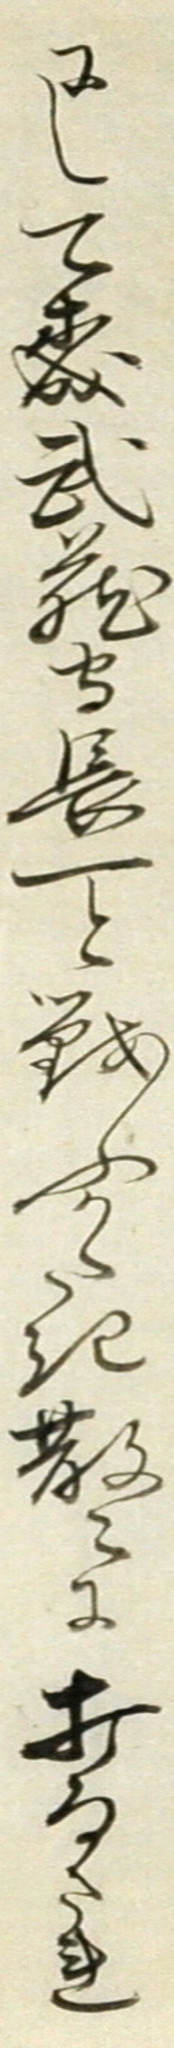にして森武蔵守長一と戦ふかたき散々に打なたれ
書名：藩翰譜（二・三）
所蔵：伊那市立高遠町図書館・合同会社AMANE
